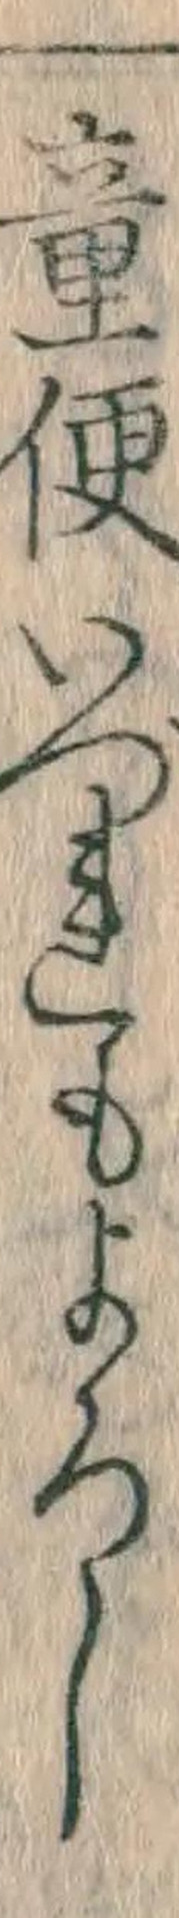童便いづれもよろし
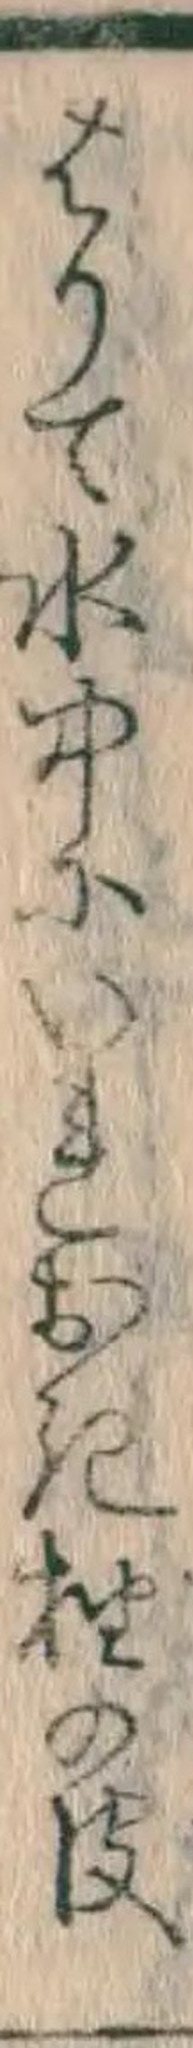はりて水中にいれおき柚の皮
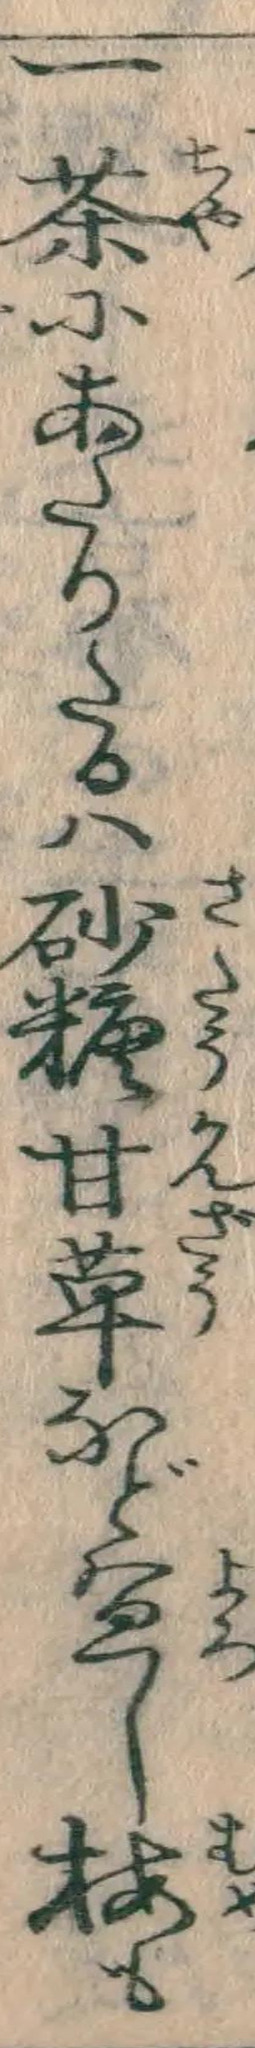一茶にあたりたるは砂糖甘草など宜し梅も
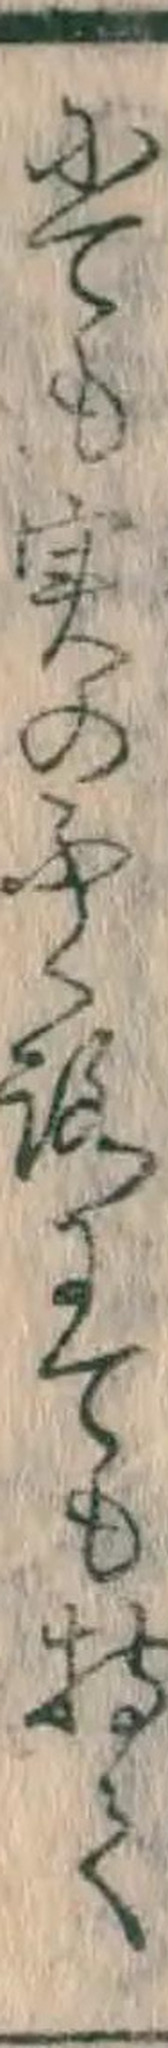にても実のふくろにても持て
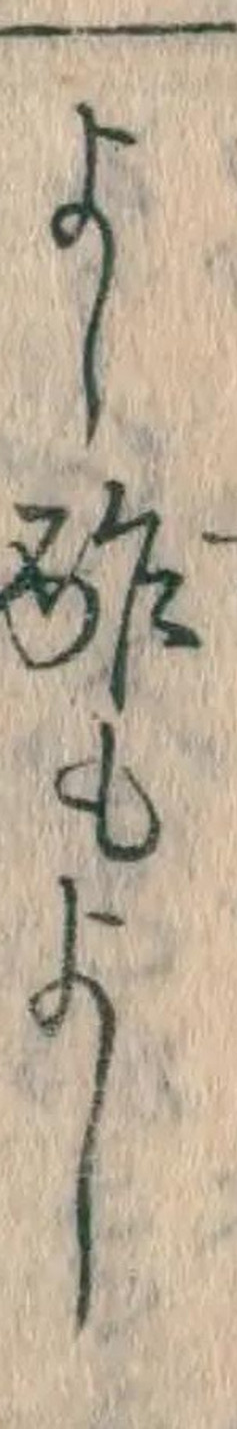よし酢もよし
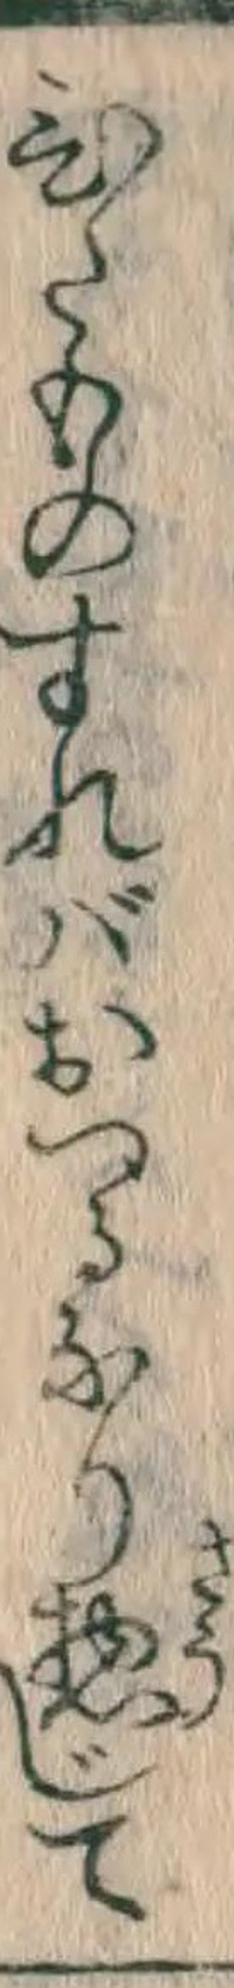ひたものすればおつるなり惣じて
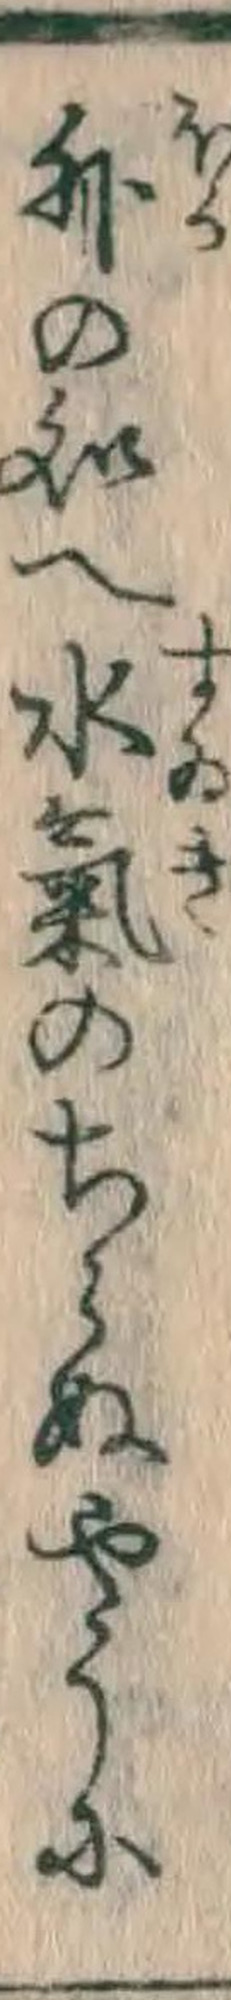外の処へ水気のちらぬやうに
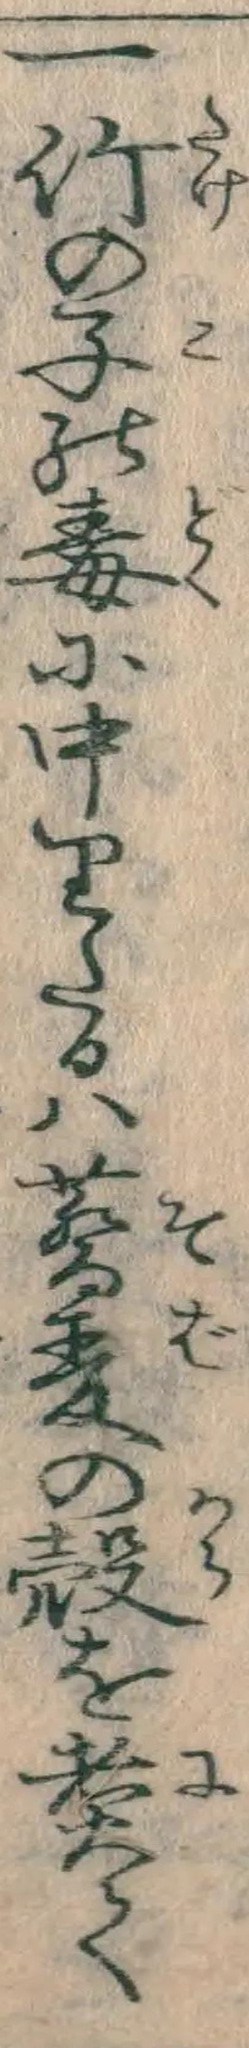一竹の子の毒に中りたるは蕎麦の殻を煮て
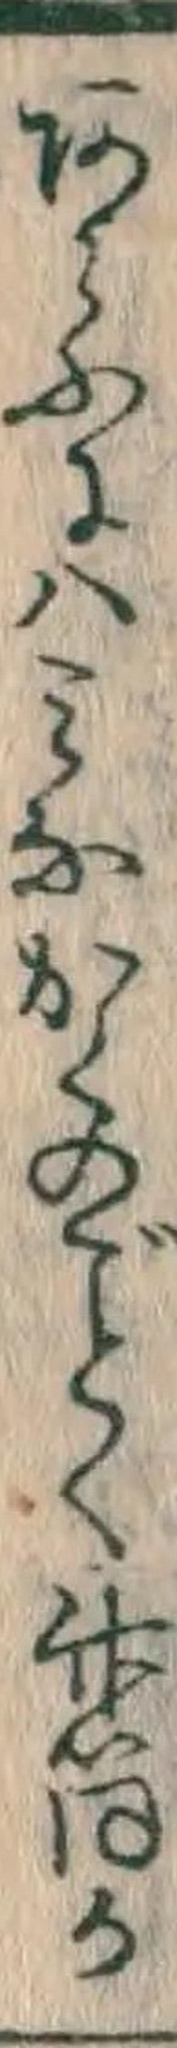あらふにはみなかくのごとく竹筒か
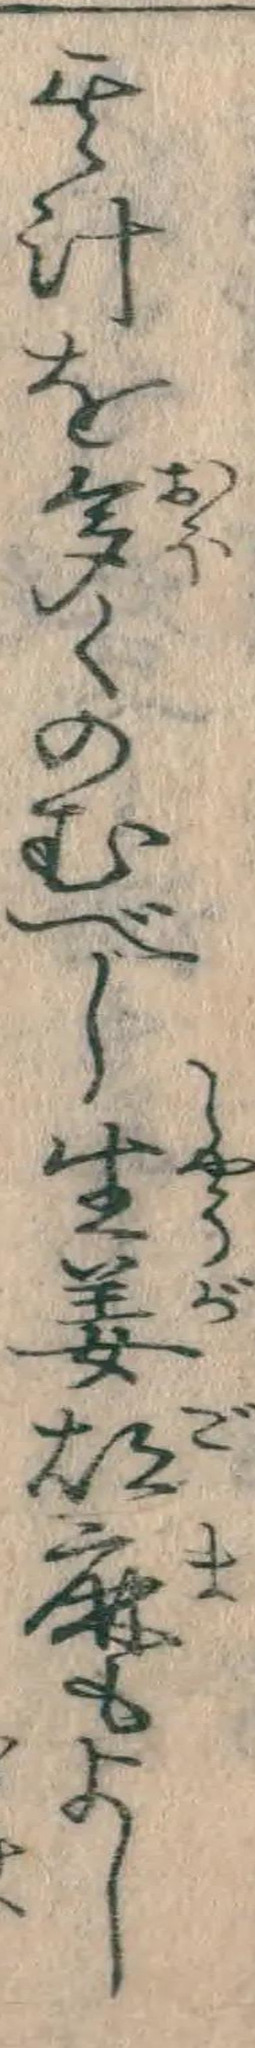其汁を多くのむべし生姜胡麻もよし
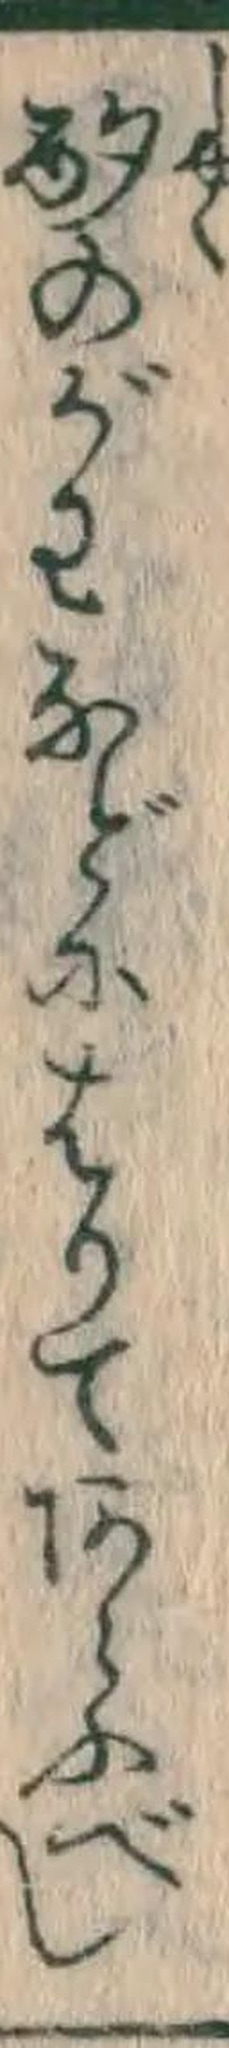酌のがわなどにはりてあらふべし
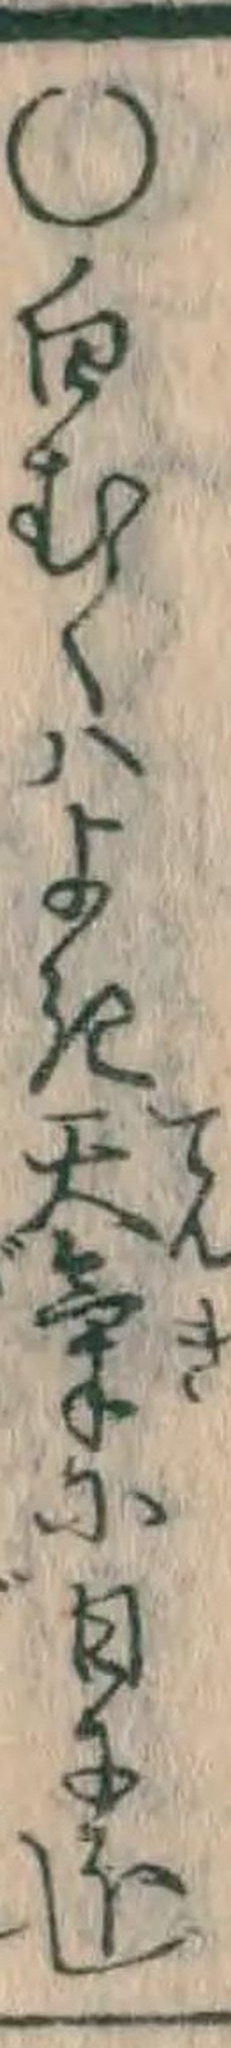○白むくはよき天気に日にほし
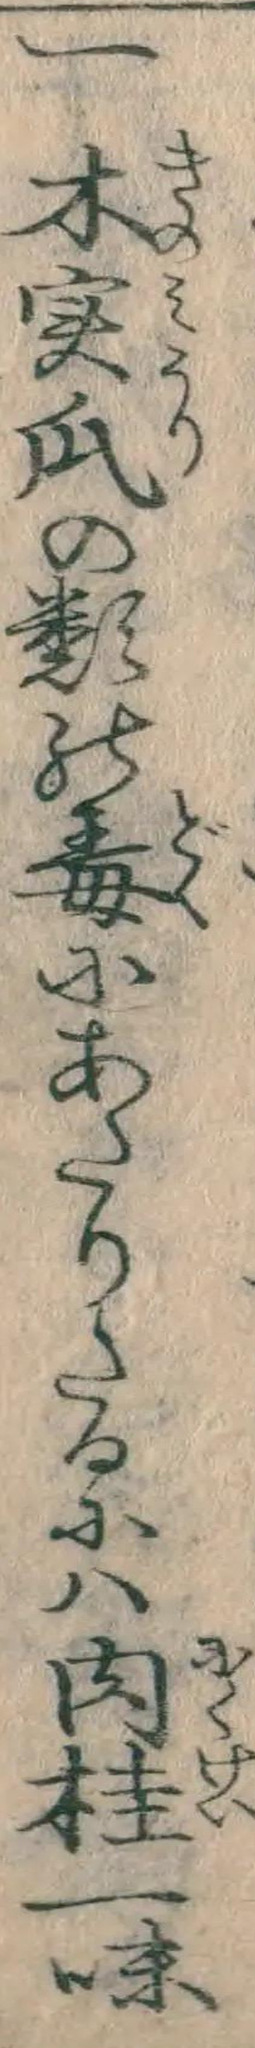一木実瓜の類の毒にあたりたるには肉桂一味
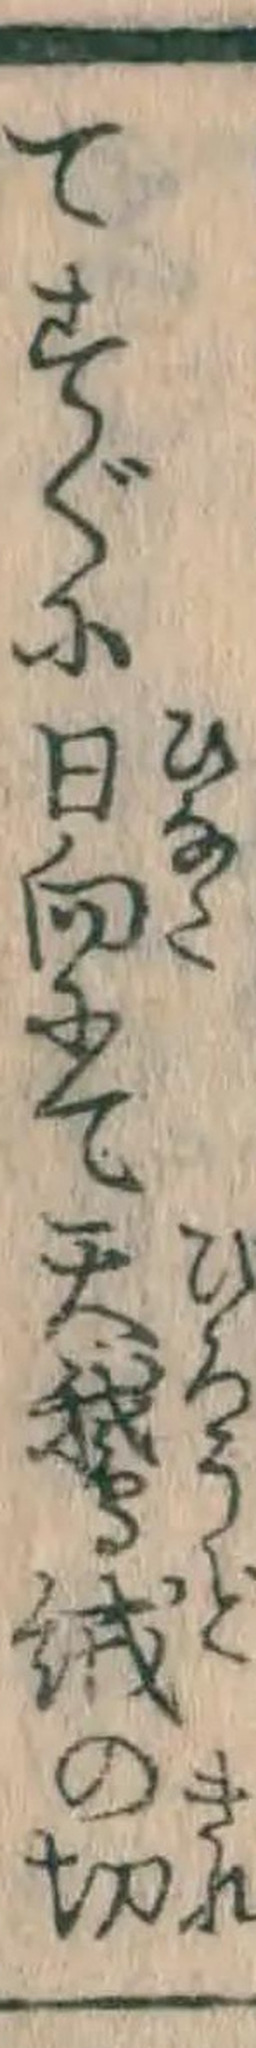てすぐに日向にて天鵞絨の切
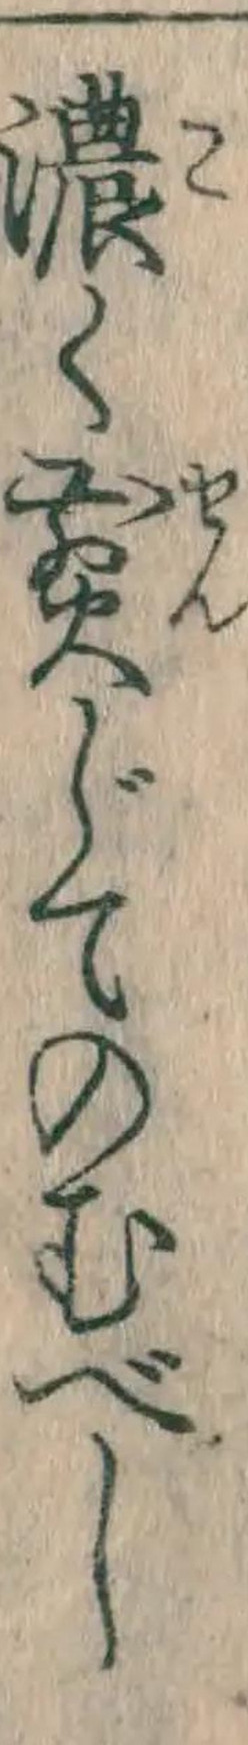濃く煎じてのむべし

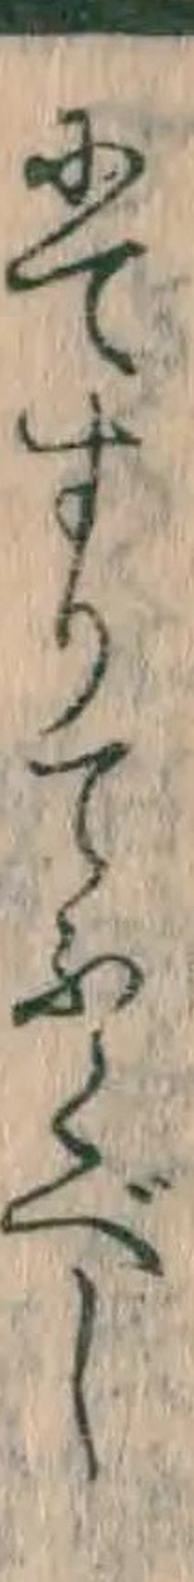にてすりてふくべし
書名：広益秘事大全 3巻. [3]
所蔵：国立国会図書館 National Diet Library, JAPAN
